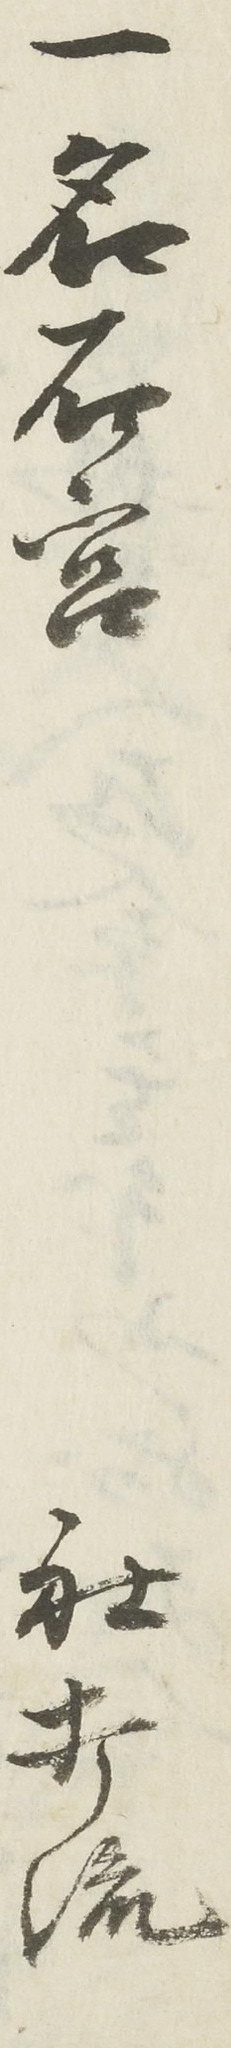一名石宮社打流
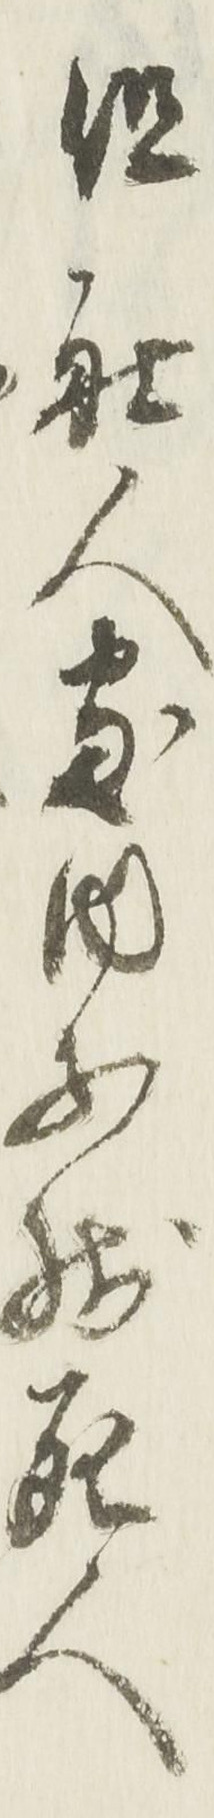但社人家他不残死人
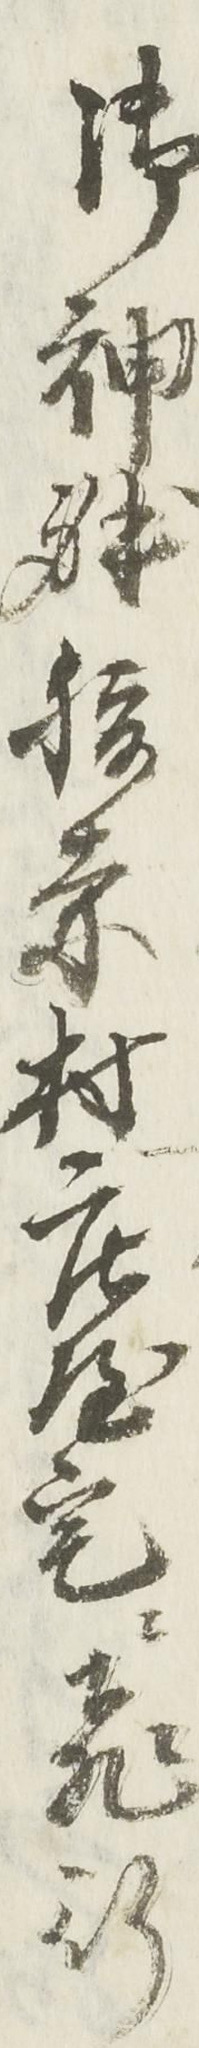御身躰猿赤村庄屋宅ニ飛行
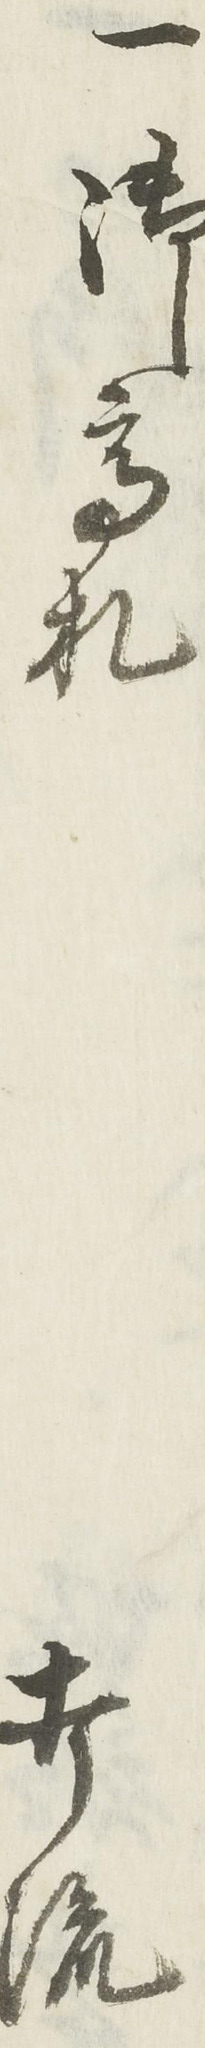一御高札打流
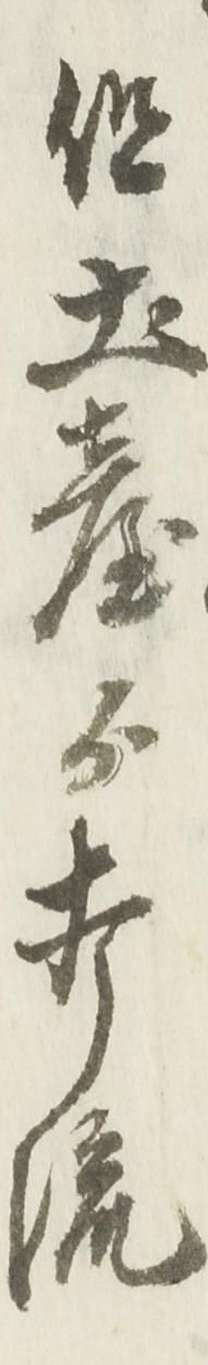但土台ゟ打流
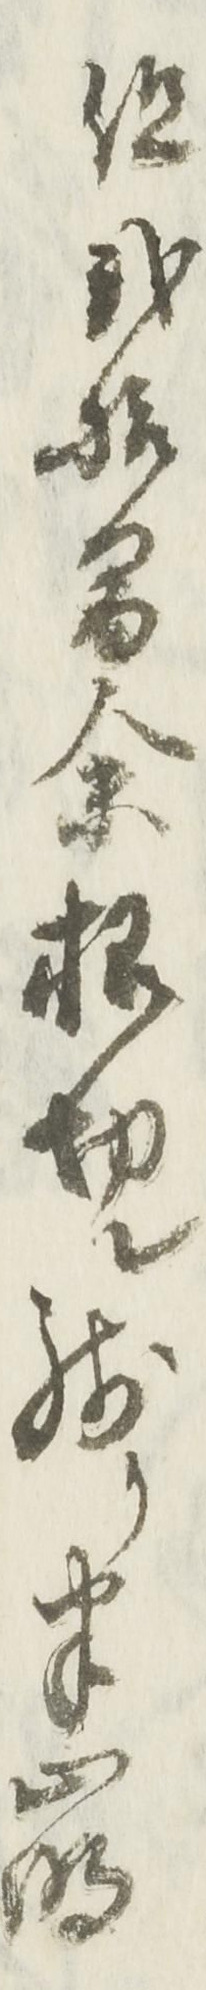但弐拾間余根切レ残リ半崩
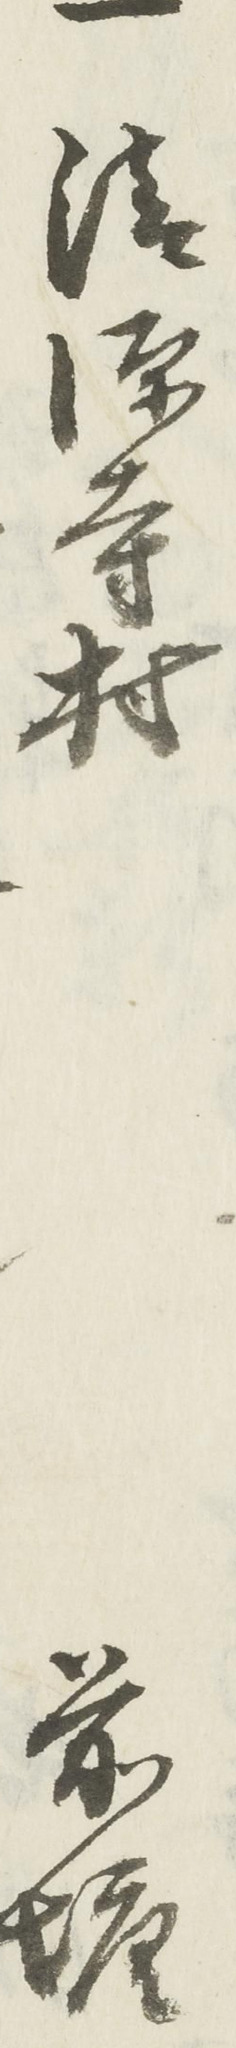一清源寺村前塘
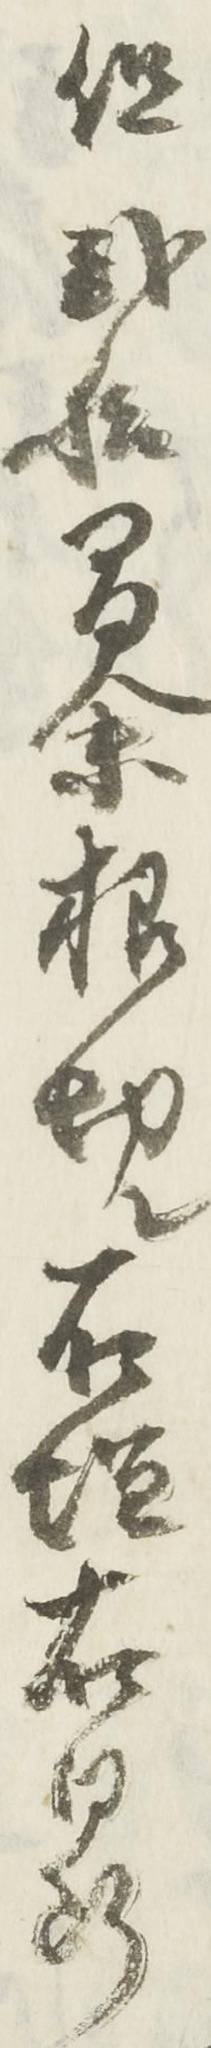但弐拾間余根切レ石垣右同断
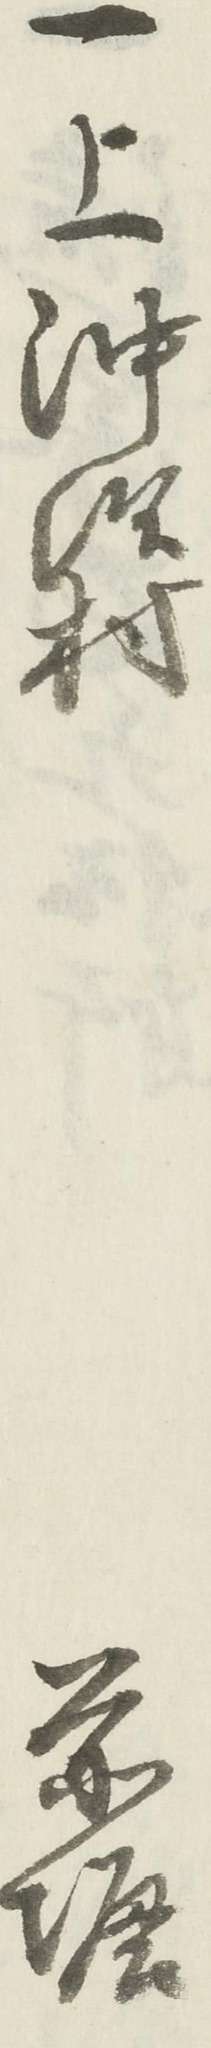一上沖次村前塘
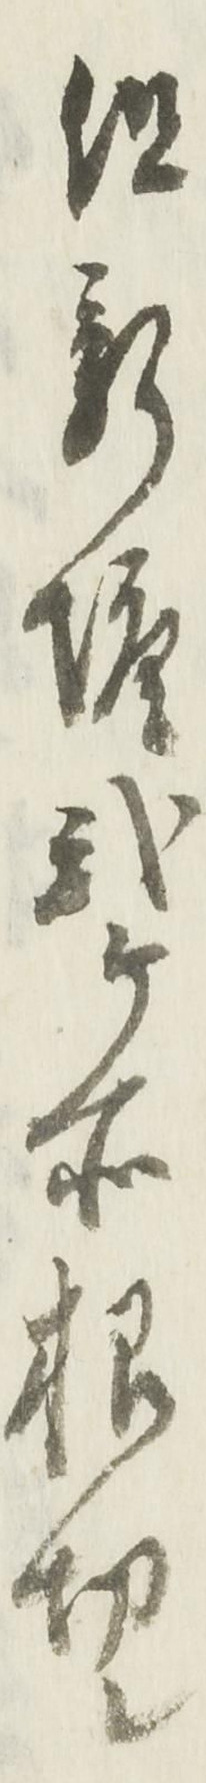但新塘弐ケ所根切レ
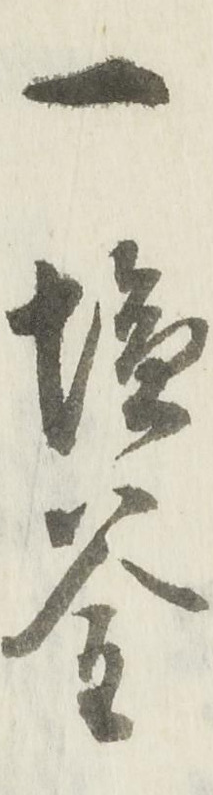一塩釜
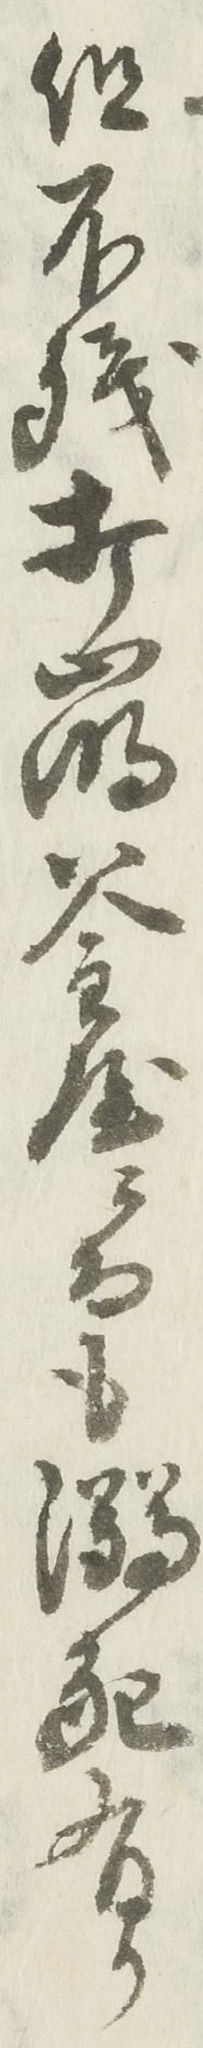但不残打崩釜屋ニ而も溺死有り
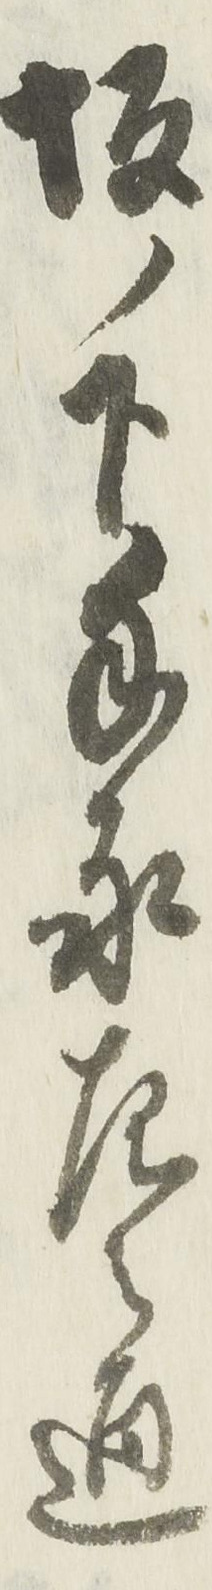坂ノ下手永左之通
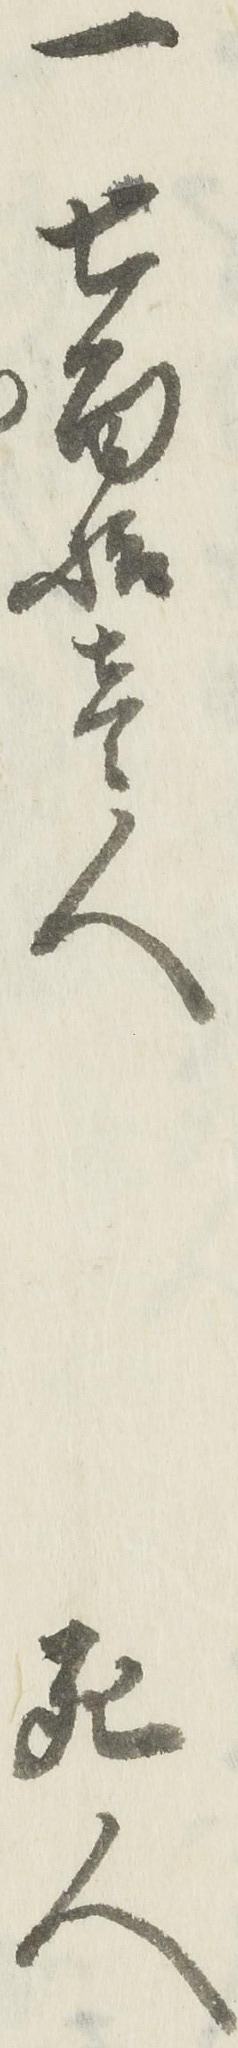一七百拾壱人死人
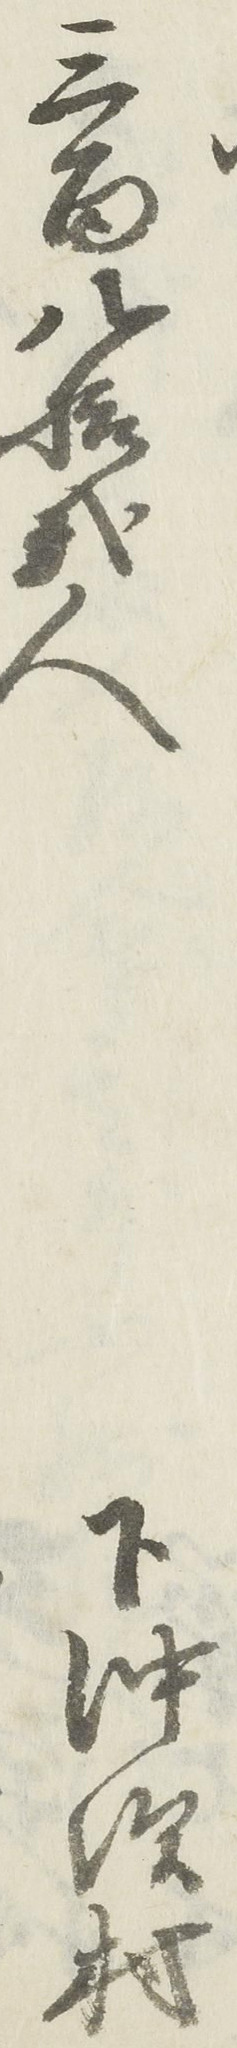三百八拾弐人下沖次村
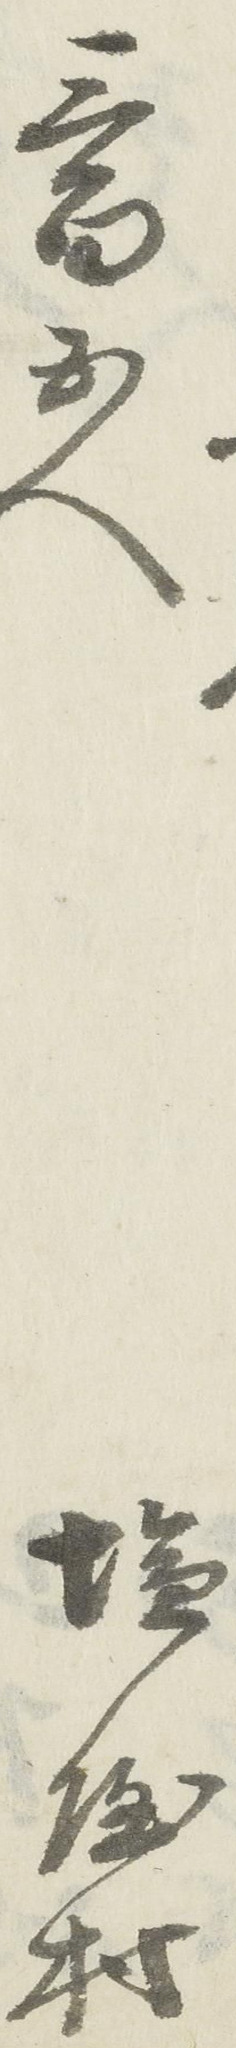三百五人塩屋村
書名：後見笑
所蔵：東京大学地震研究所図書室 Earthquake Research Institute Library, The University of Tokyo, JAPAN
